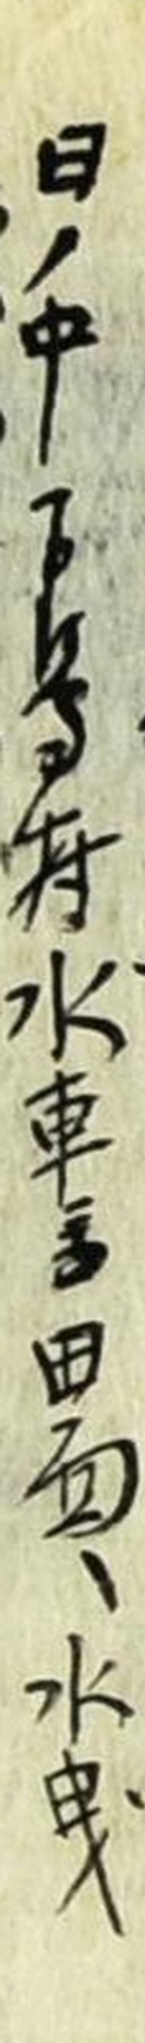日の中下江守村水車ニ而田面へ水曳
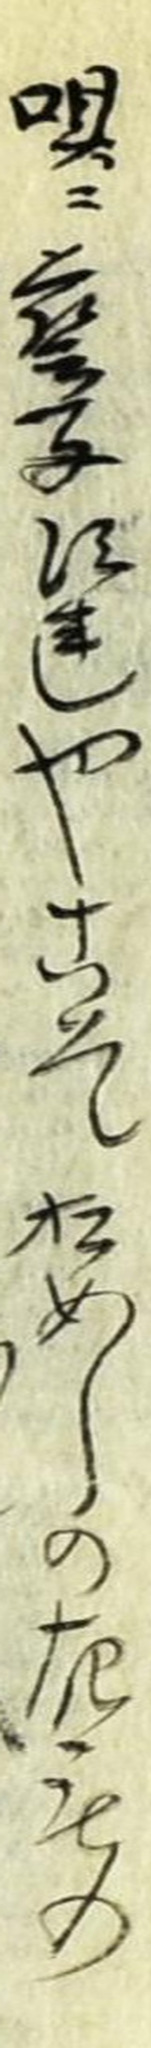唄ニ芸子すれやこそおめしのきもの

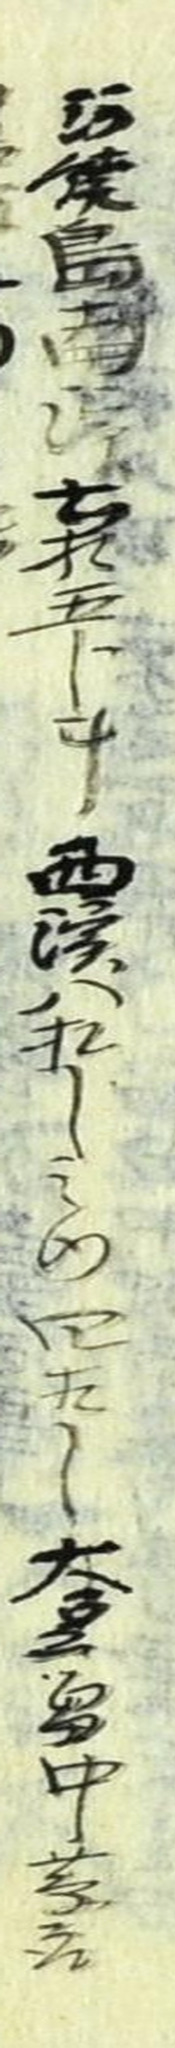河饒島南浜六拾五歩計西浜八拾歩之内四拾歩大豆畠中草取
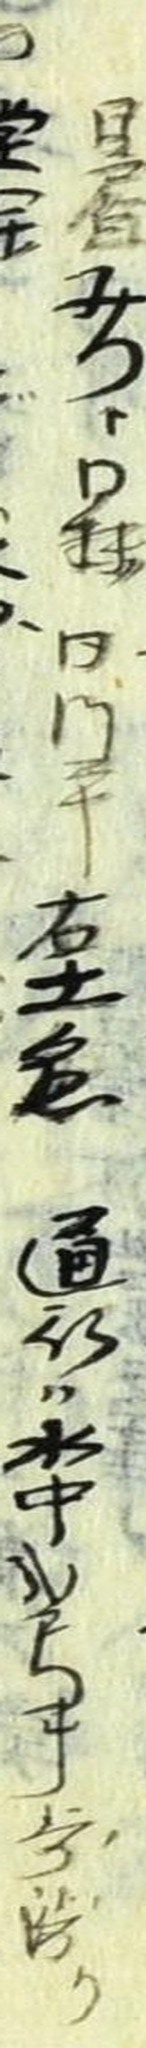日雇みつト同様同門平右土懸通行ハ水中弐尺計歩渉り
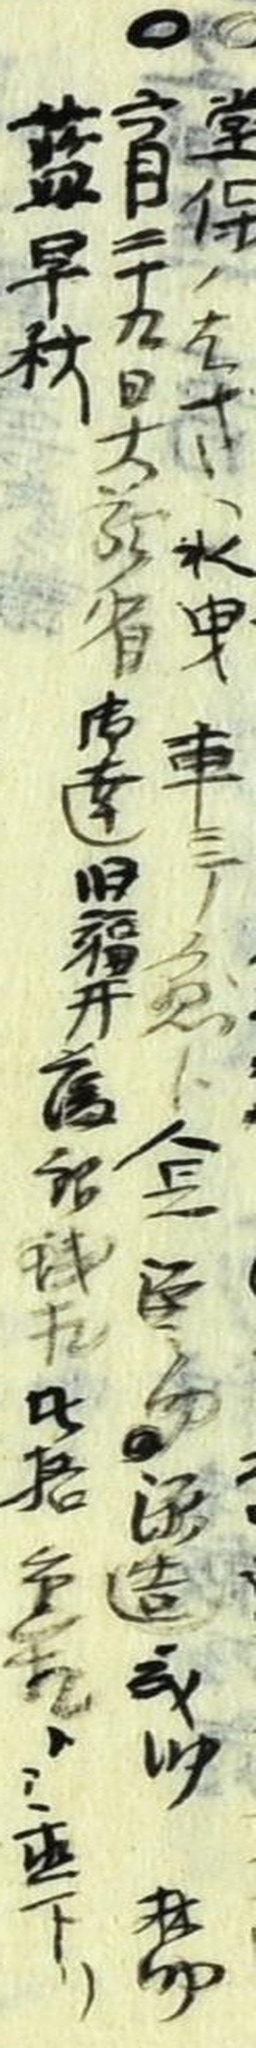○六月二十九日大蔵省御達旧福井藩銀銭札比格金札ト之直下り
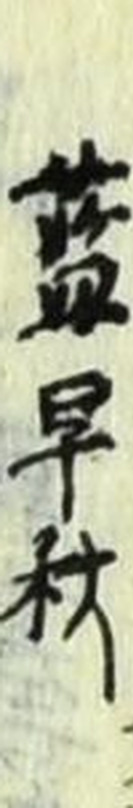藍早秋
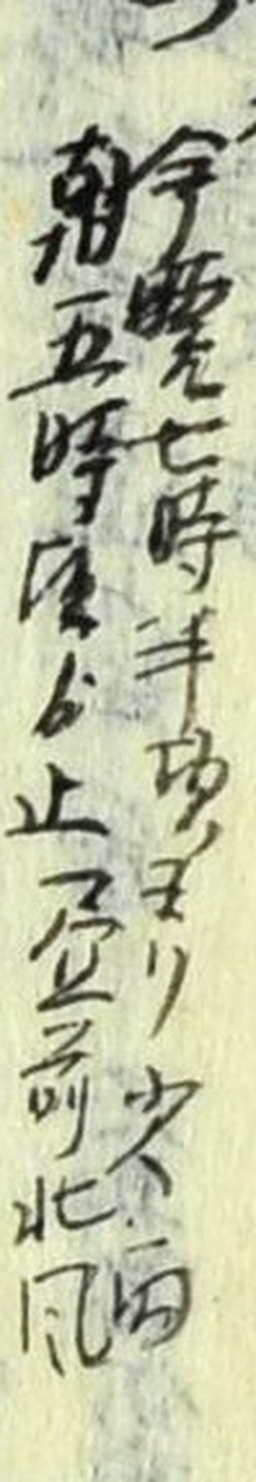朝五時頃ゟ止昼前北風
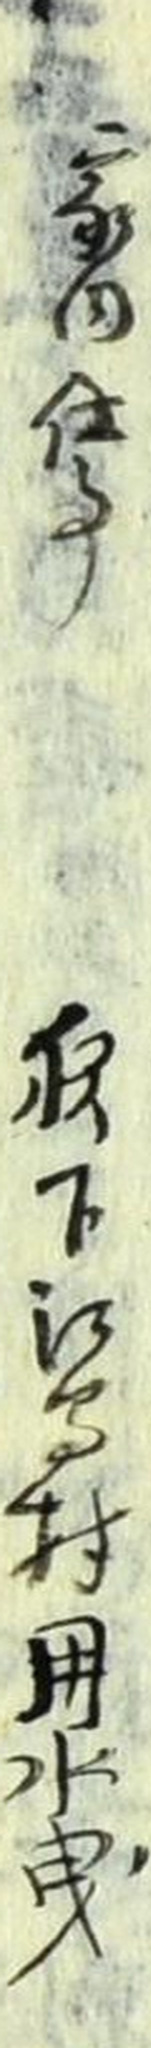家内仕事夜下江守村用水曳
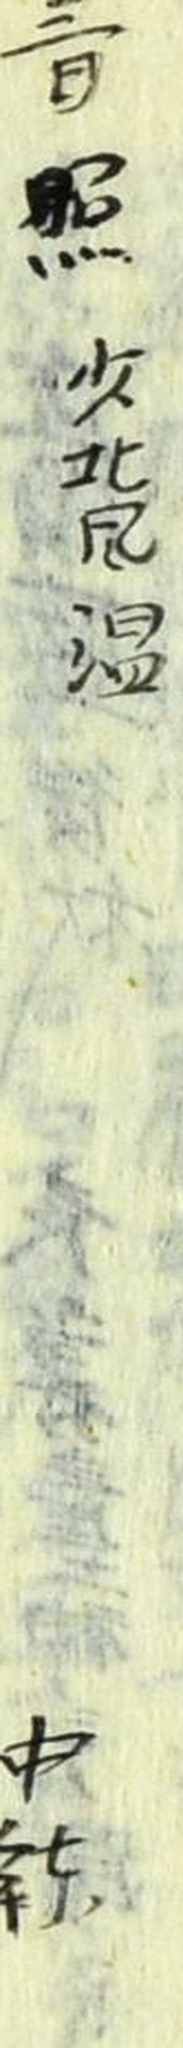三日照少北風温中鰊
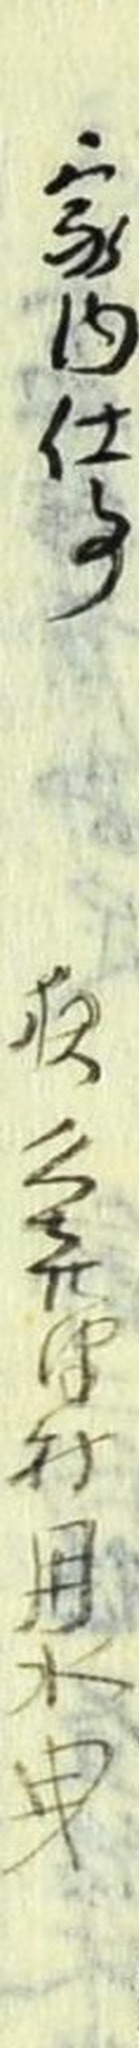家内仕事夜久喜津村用水曳
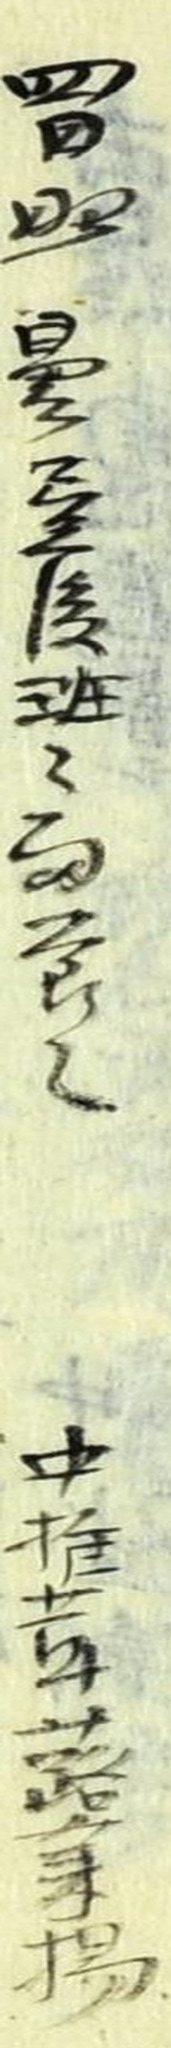四日照曇昼後班々雨節之中椎茸蕗菜揚
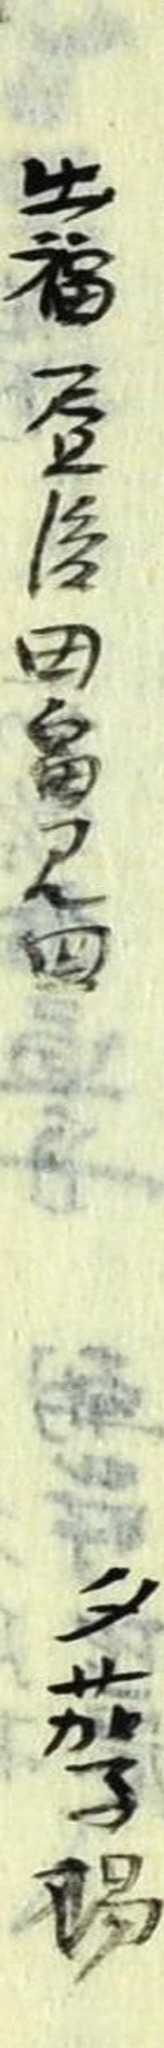出福昼後田畠見回夕茄子揚
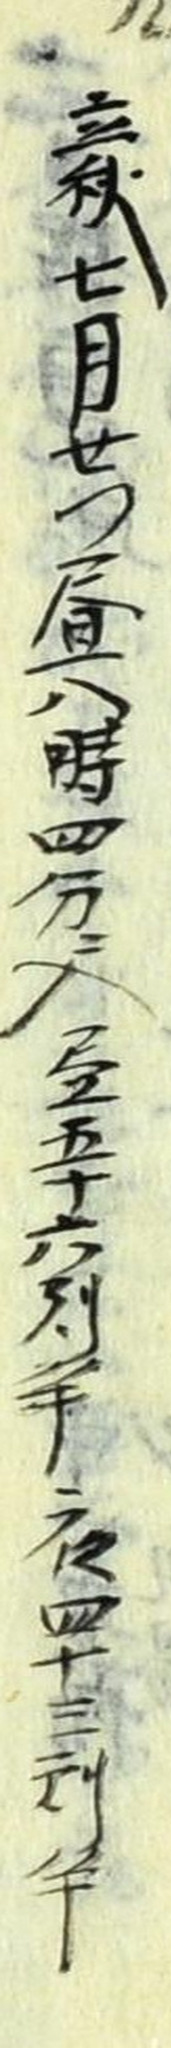立秋七月せつ昼八時四分ニ入昼五十六刻半夜四十三刻半
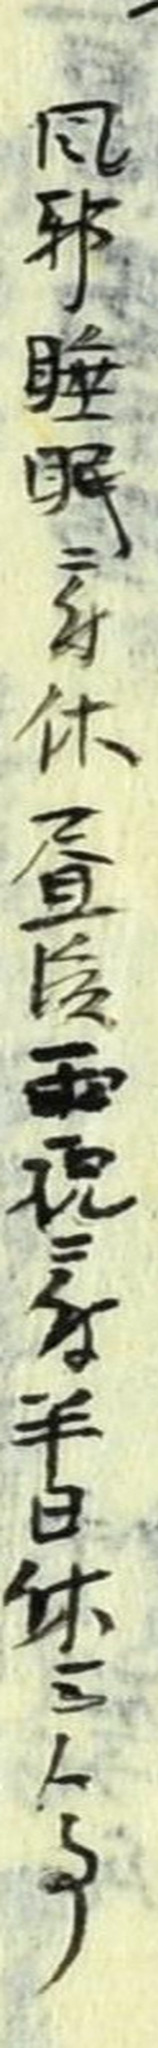風邪睡眠に付休昼後雨祝に付半日休ニ而候事
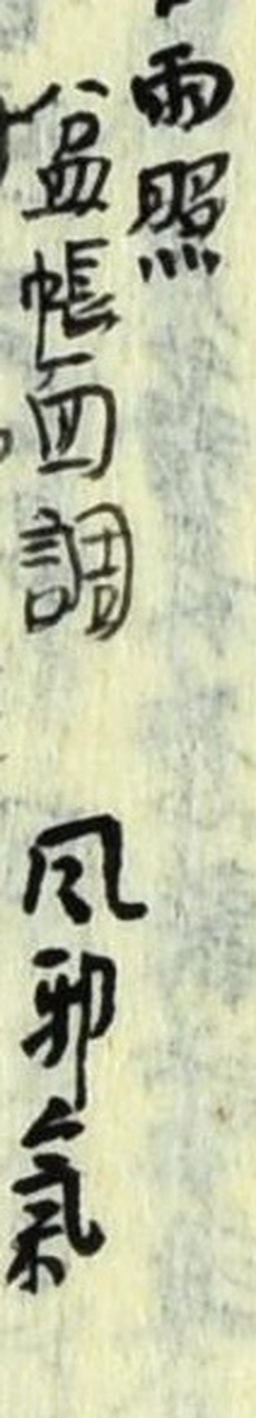盆帳面調風邪気
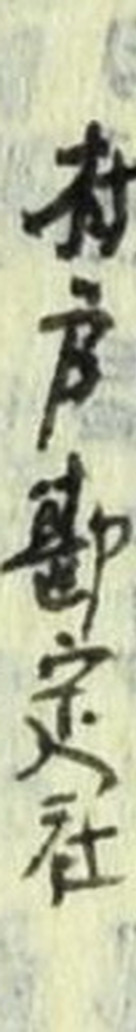村方勘定社
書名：（日記）
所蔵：福井県文書館 Fukui Prefectural Archives
